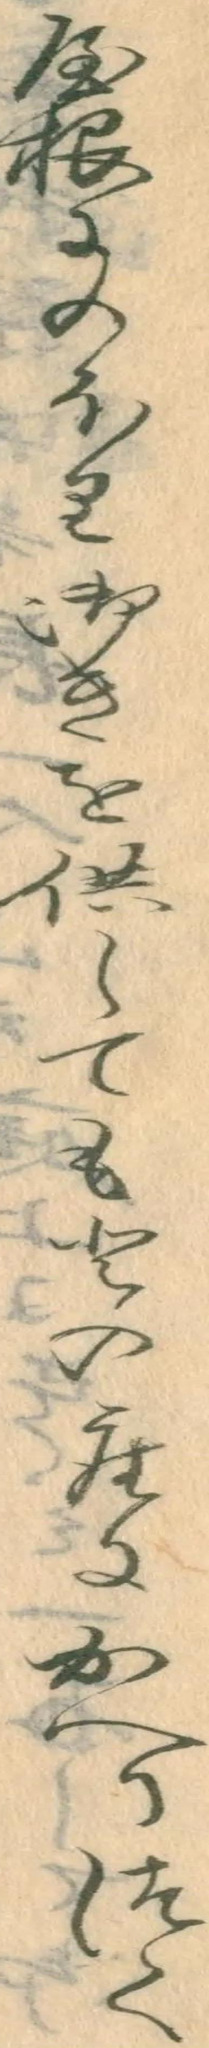屋根にのほり御きを供してもとの座にかへりつく
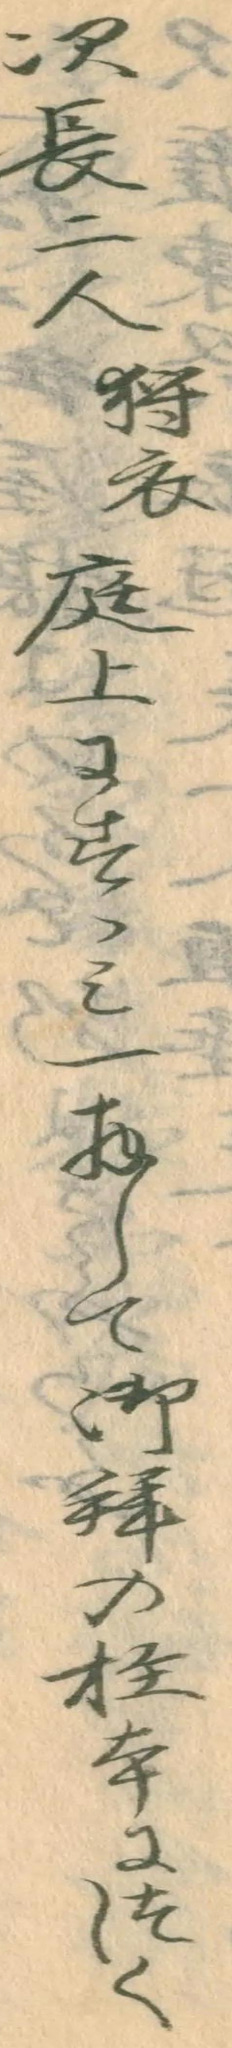次長二人狩衣庭上にすゝみ一拝して御拝の柱本につく
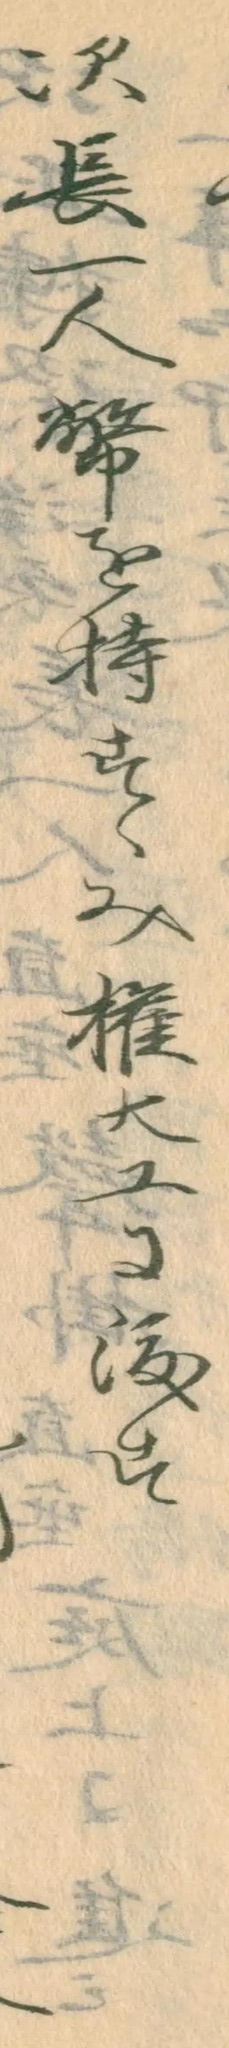次長一人幣を持すゝみ権大工に渡す
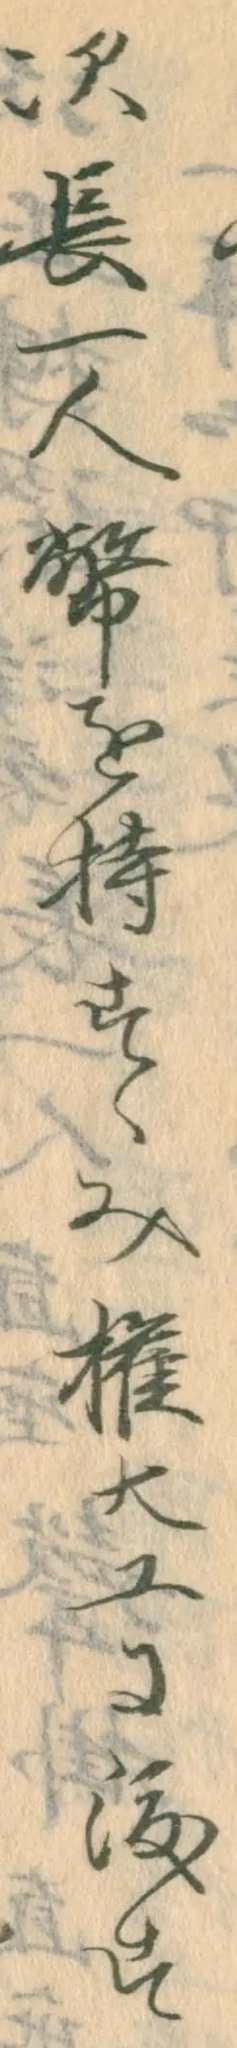次長一人幣を持すゝみ権大工に渡す
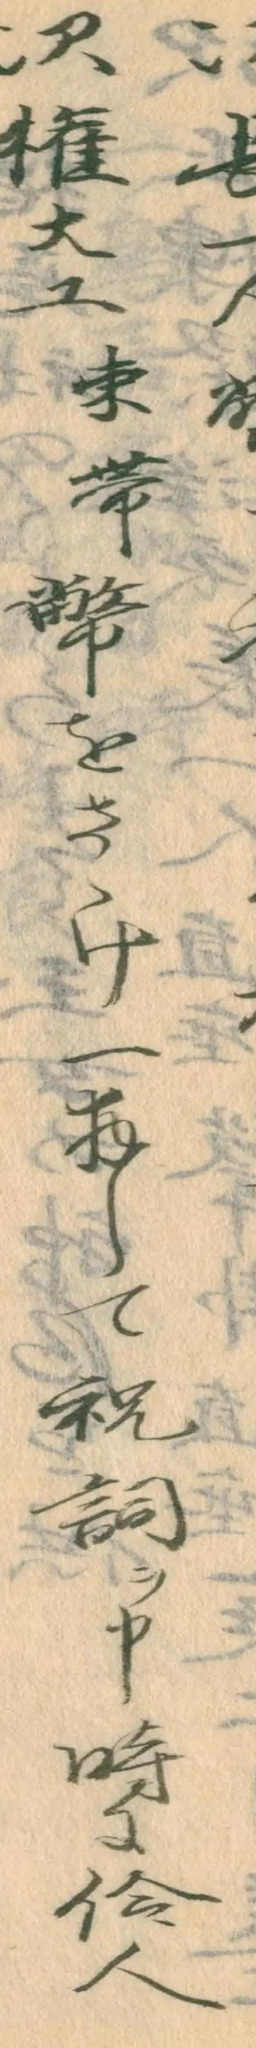次権大工束帯幣をさゝけ一拝して祝詞ヲ申時に伶人
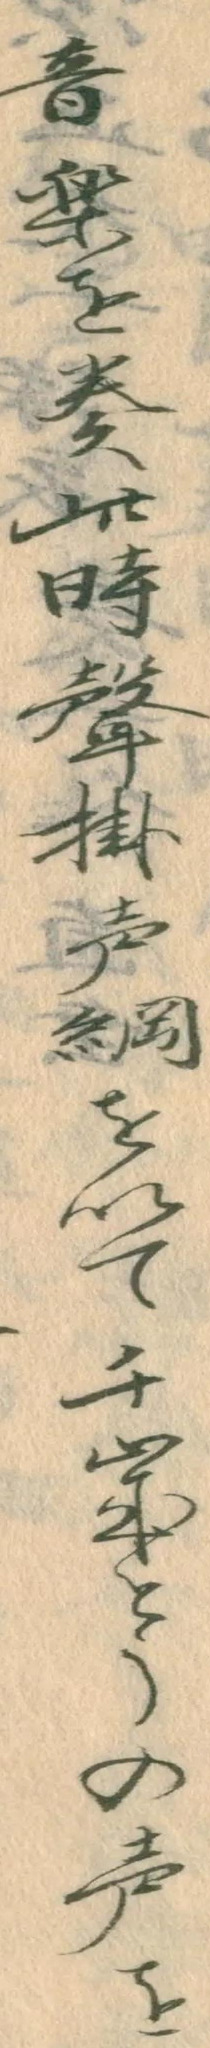音楽を奏此時声掛声綱を以て千歳とうの声を
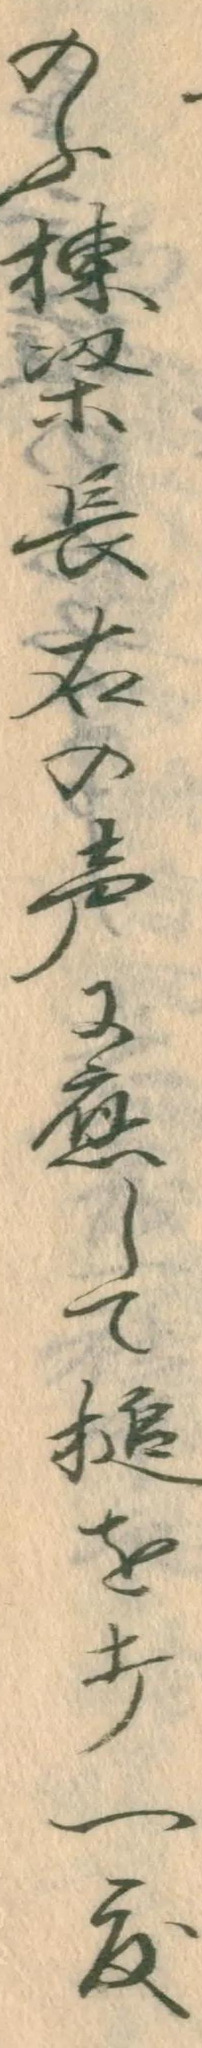のふ棟梁長右の声に応して槌を打一度
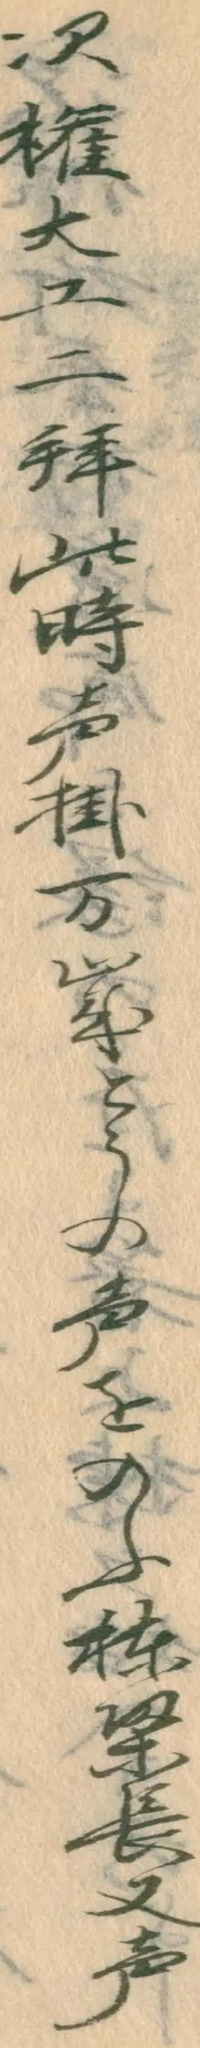次権大工二拝此時声掛万歳とうの声をのふ棟梁長又声
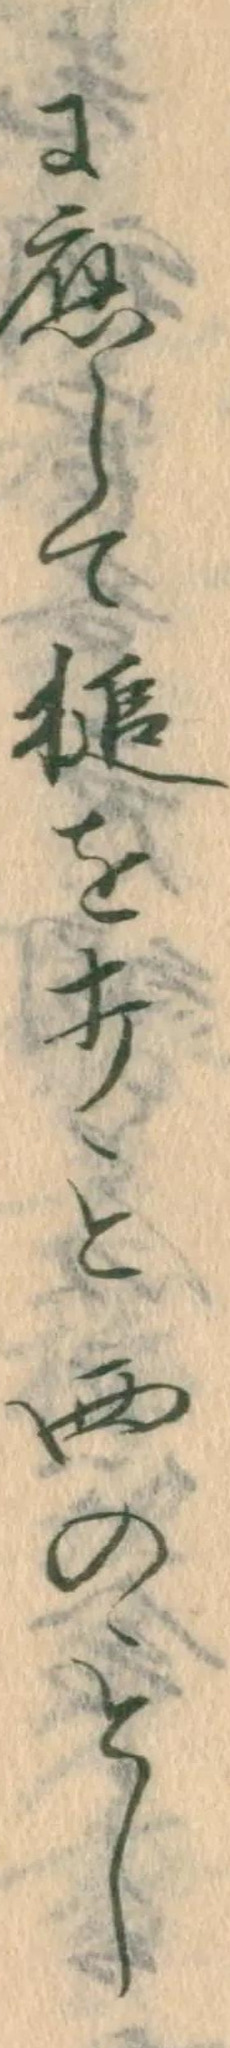に応して槌を打こと西のことし
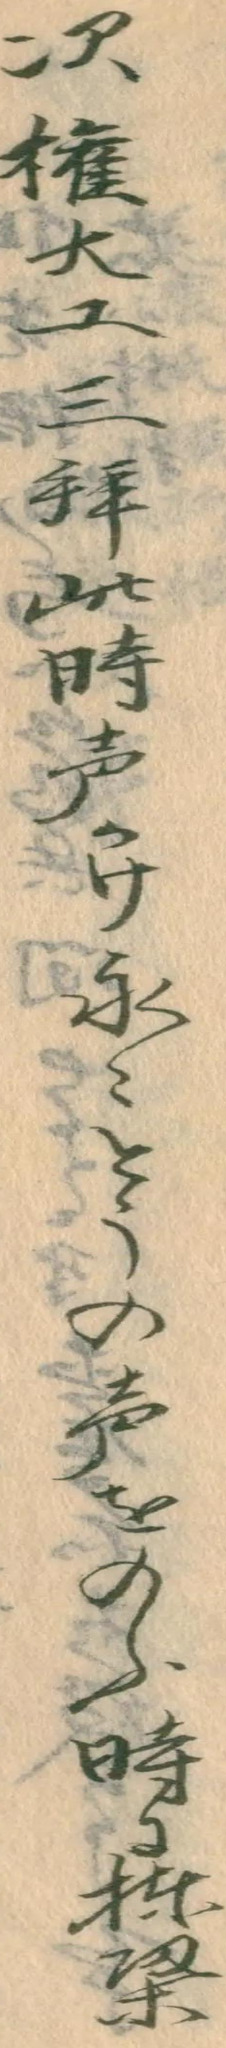次権大工三拝此時声かけ永々とうの声をのふ時に棟梁
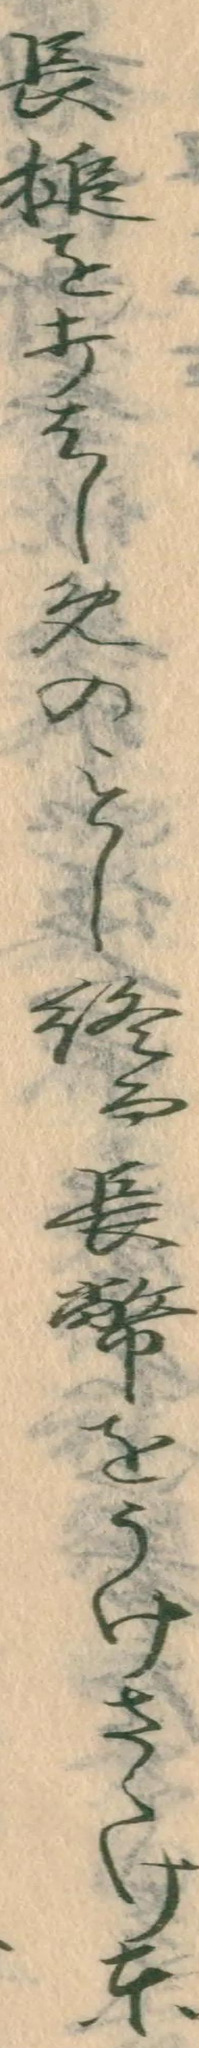長槌を打はしめのことし終而長幣をうけさゝけ東
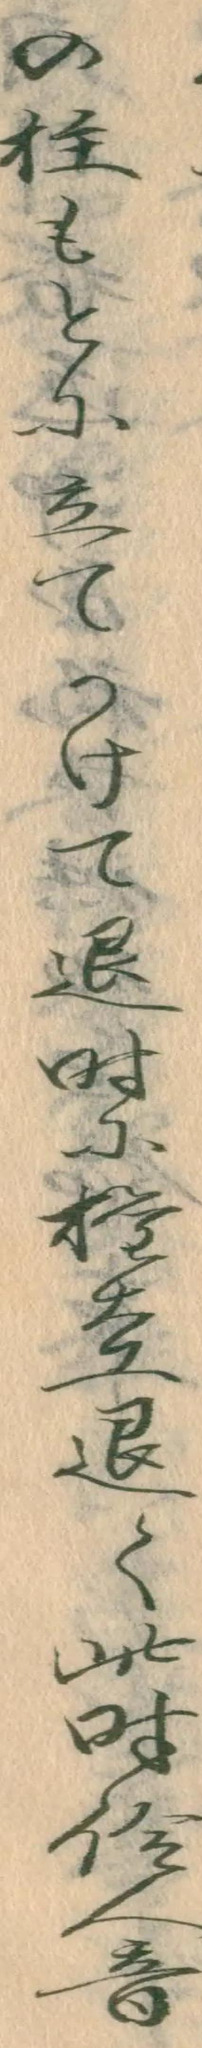の柱もとに立てかけて退時に権大工退て此時伶人音
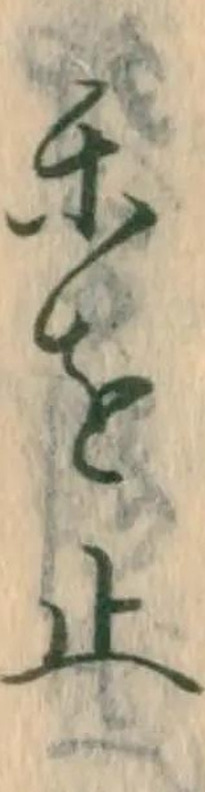楽を止
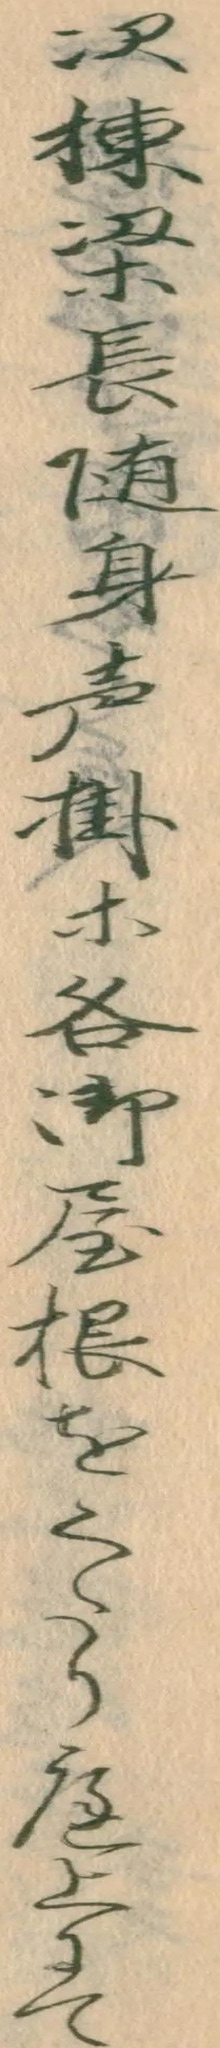次棟梁長随身声掛等各御屋根をくたり庭上にて
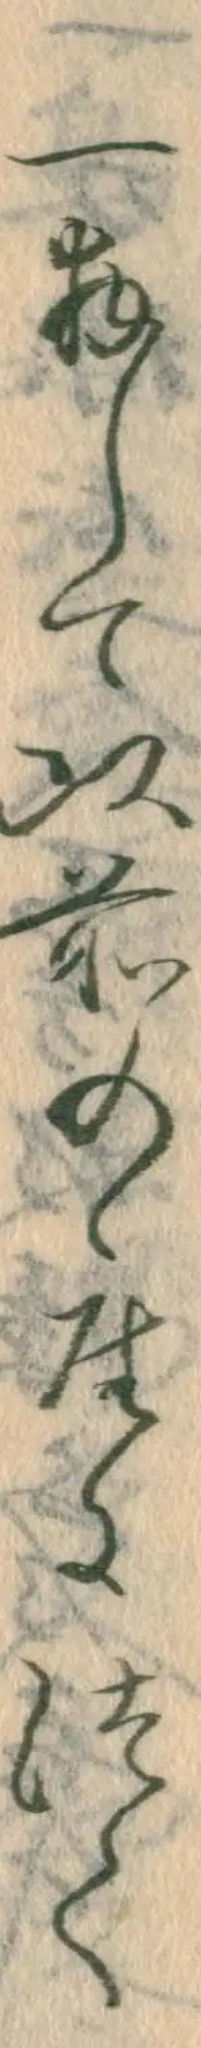一拝して以前の座につく
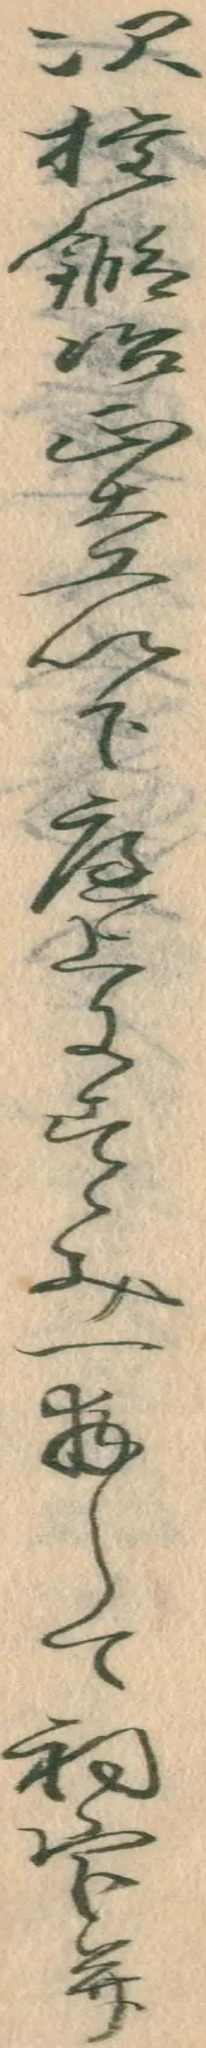次権鍛冶正大工以下庭上にすゝみ一拝して祠官并
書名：賀茂社記録. 第17冊
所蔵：国立国会図書館 National Diet Library, JAPAN
